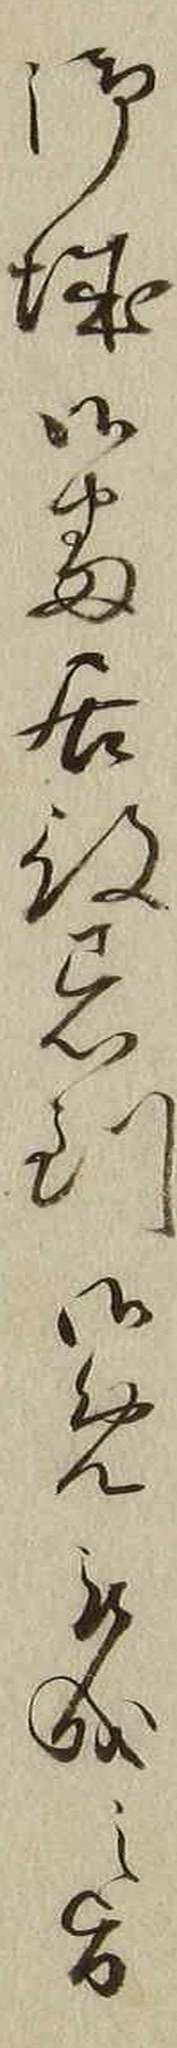御城御番居役着到御免成られ候旨
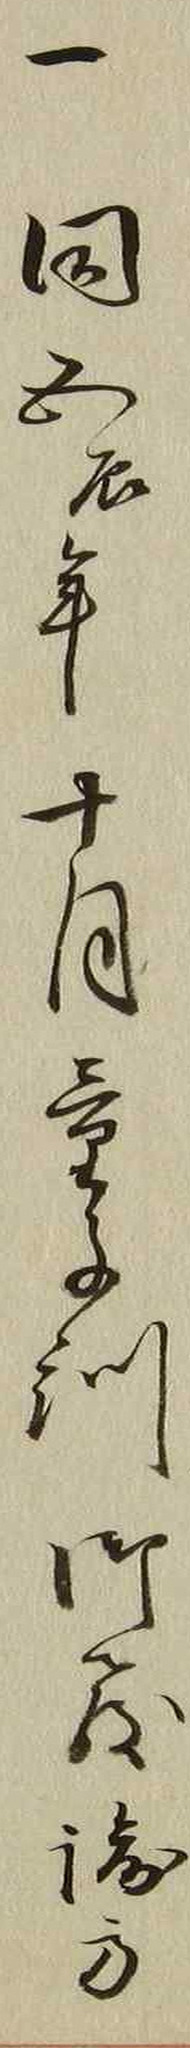一同五辰年十月童子訓御教諭方
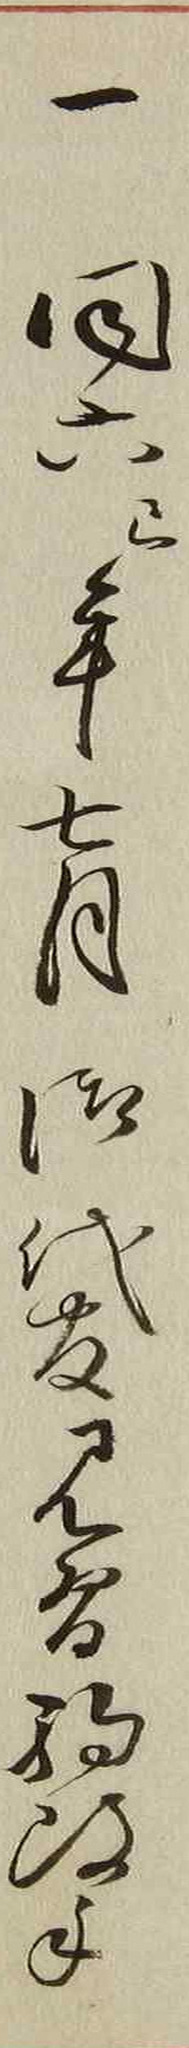一同六巳年七月御代官見習駒改手
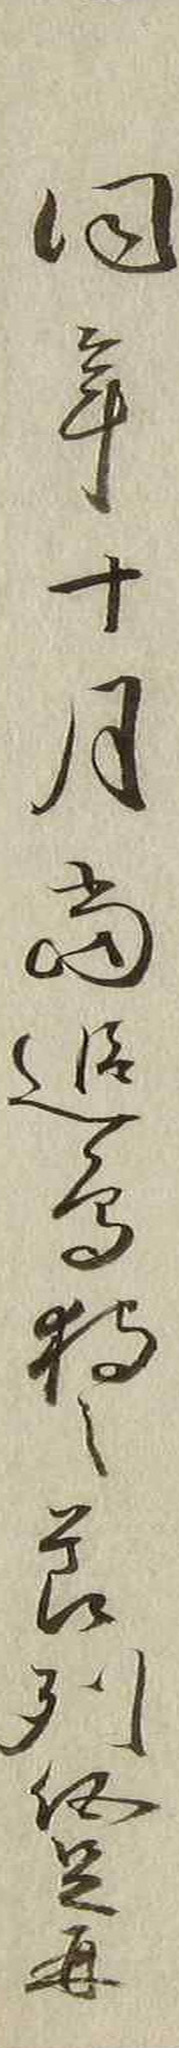一同年十月当追鳥狩之節列伍足並
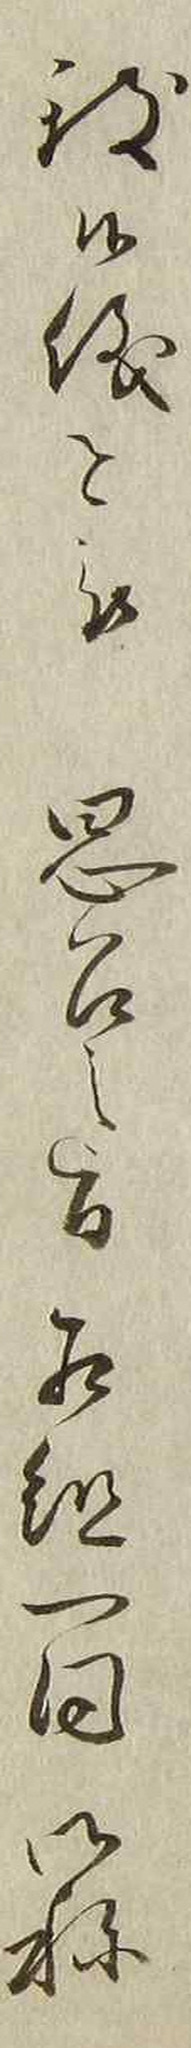致し候儀と思召され候旨相組一同御称

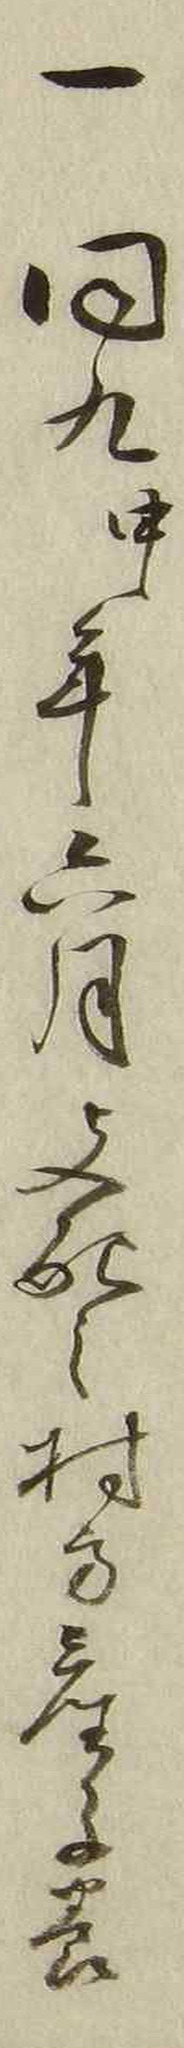一同九申年六月支配之村方産子養
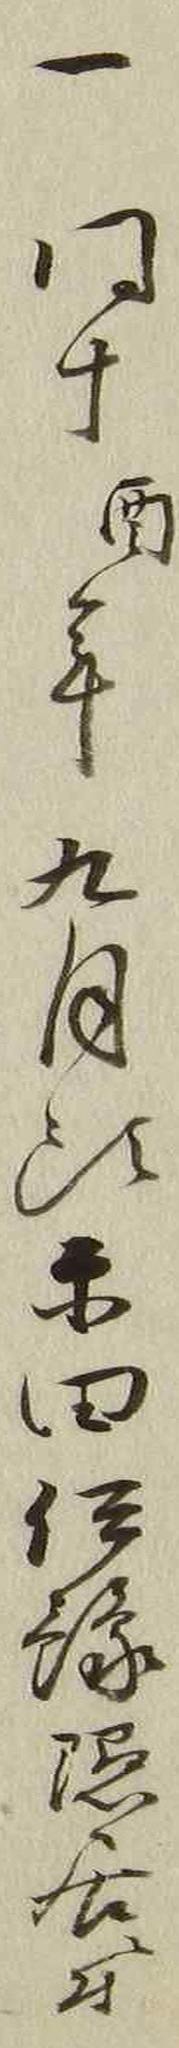一同十酉年九月頃原田伊豫隠居ニ付き
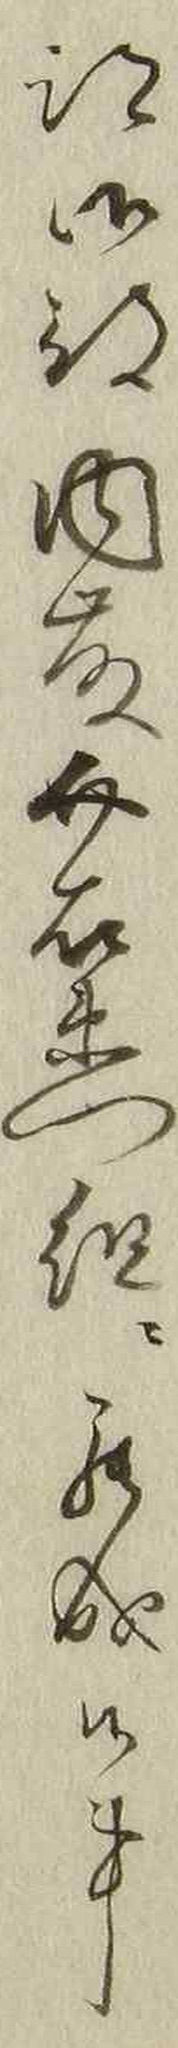跡御役内藤介右衛門組ニ罷り成り候事
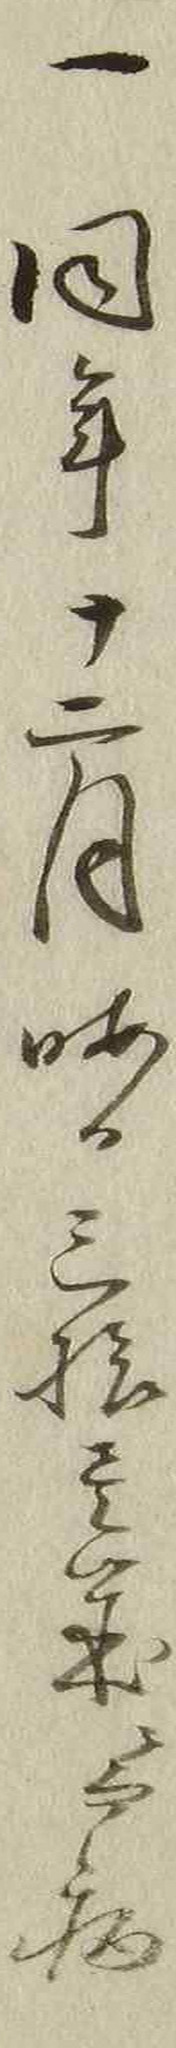一同年十二月晦日三拾壱歳ニて病
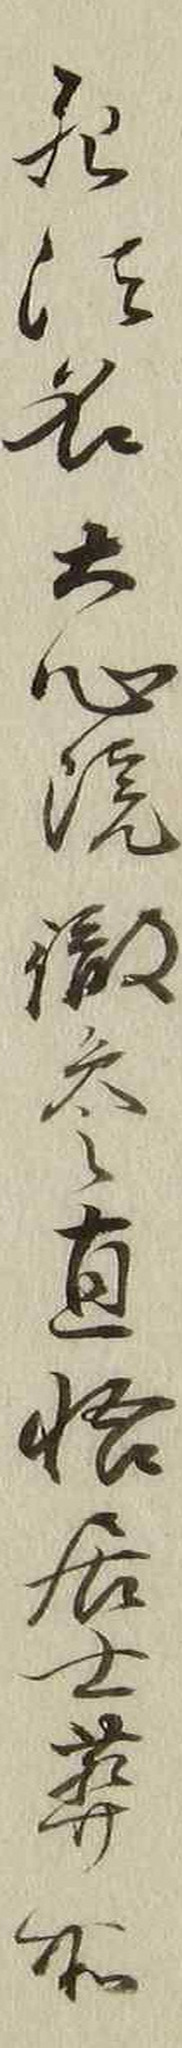死法名大心院徹尽之直悟居士葬所
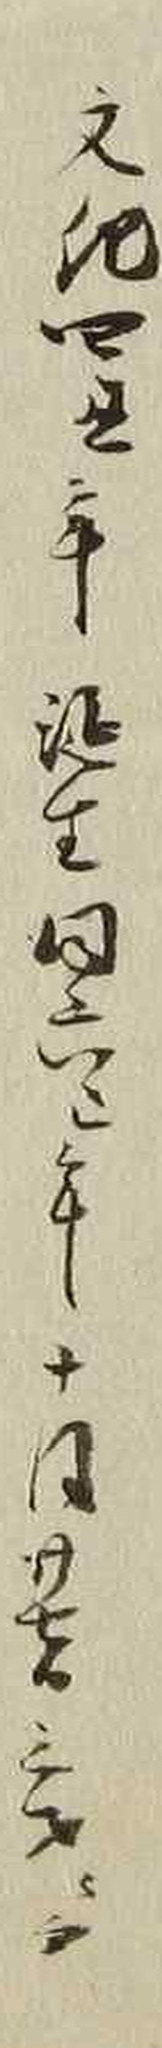文化四丑年誕生同六巳年十月廿七日三歳ニて
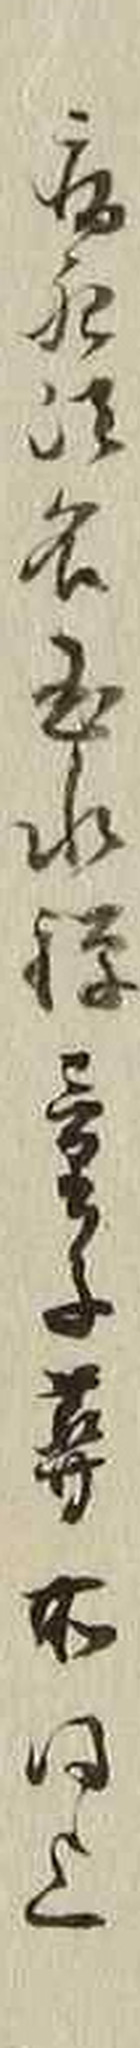病死法名玉水禅童子葬所同上
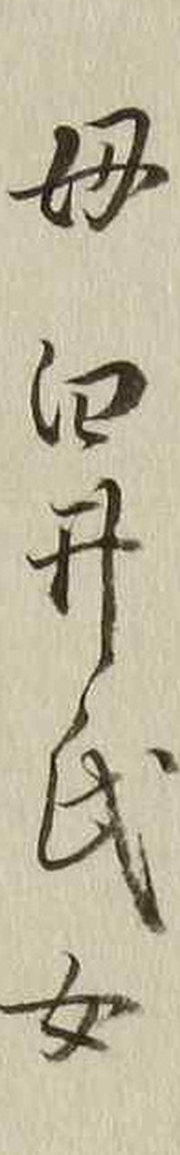母白井氏女
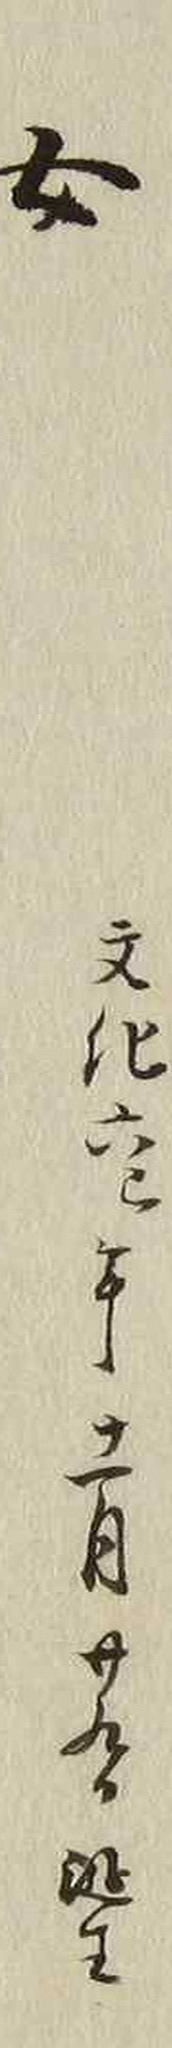女文化六巳年十一月十九日誕生
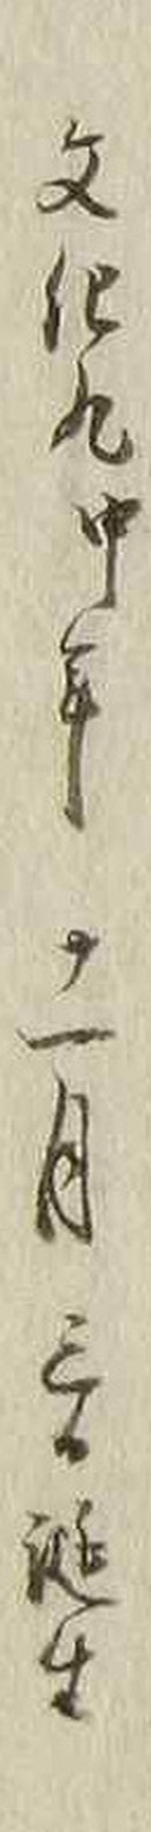女文化九申年十一月三日誕生
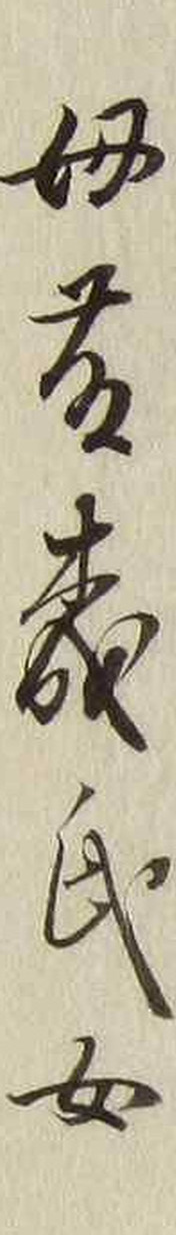母藤森氏女
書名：諸士系譜　巻之20　い之部20
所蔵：会津若松市立会津図書館
